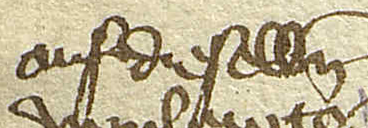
auf dieſelbn*
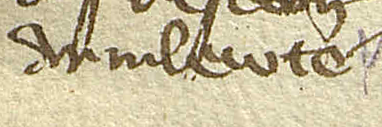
Armlewte
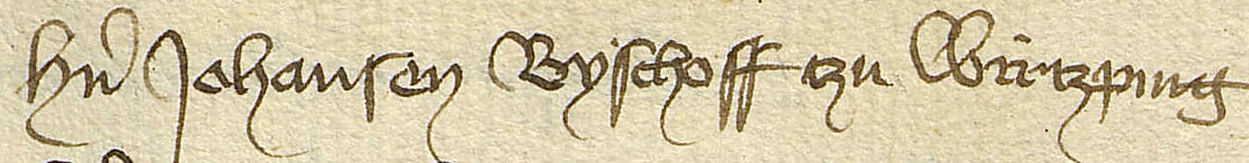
hn* Iohanſen Byſchoff cʒu Wircʒpurg
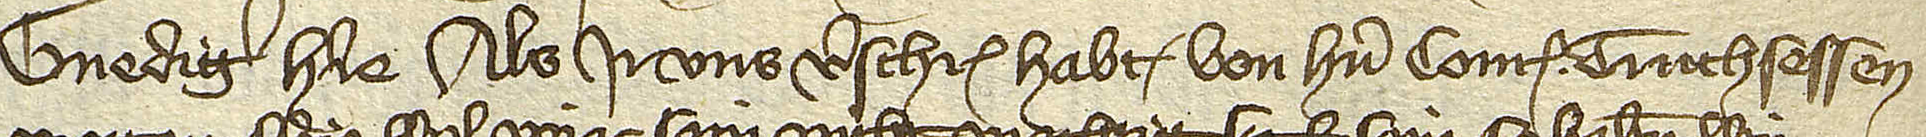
Gnedig* h*re Als Ir vns v*ſchr* habt / von hn* Conr* Truchſeſſen
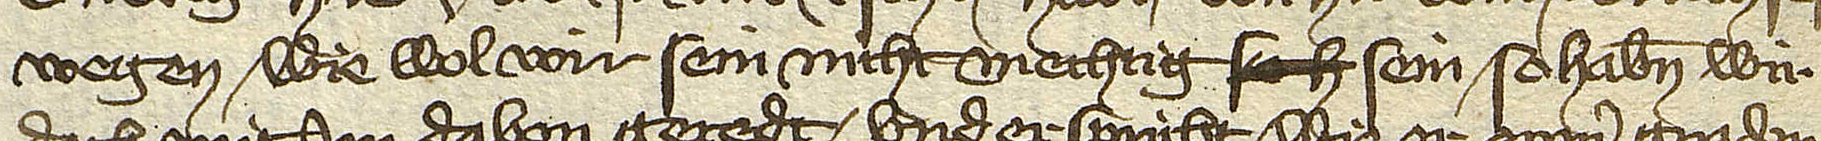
wegen / wie wol wir ſein nicht mechtig ſe h ſein / ſo habn* wir
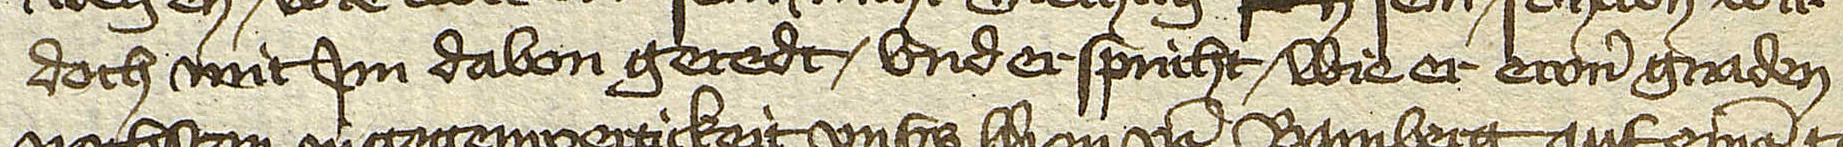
doch mit Im davon geredt / vnd er ſpricht / wie er ewn* gnaden
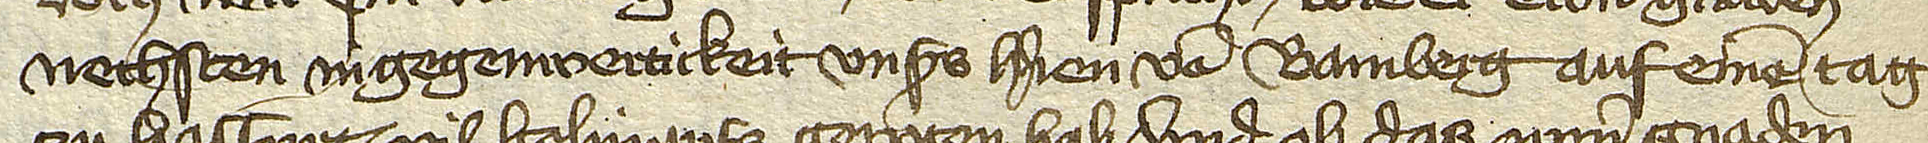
nechſten in gegenwertickeit vnſ*s h*ren vo* Bamburg auf eine* tag
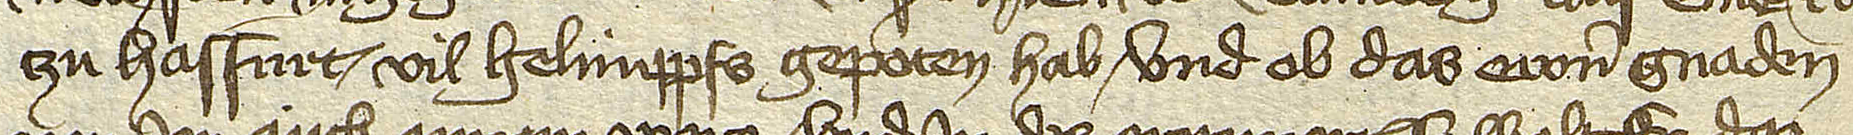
cʒu haſfurt / vil gelimppfs gepoten hab / vnd ob das ewn* gnaden
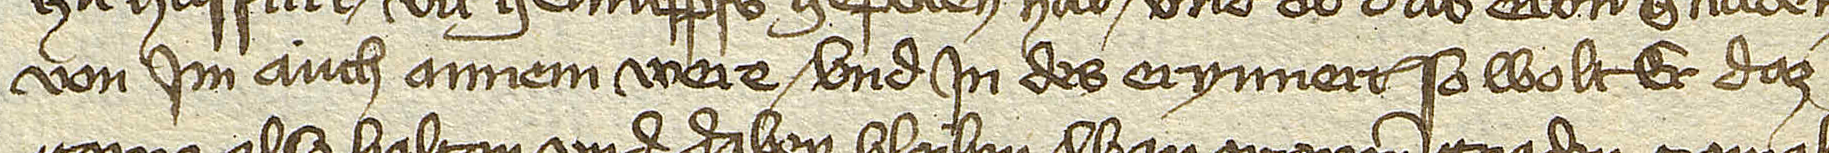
von Im auch armen were / vnd In des erynnert* ſo wolt Er daʒ
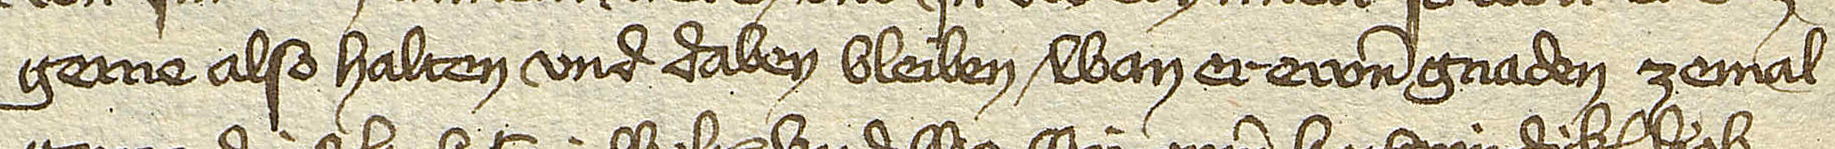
gerne alſo halten vnd dabey bleiben / wan er ewn* gnaden ʒemal
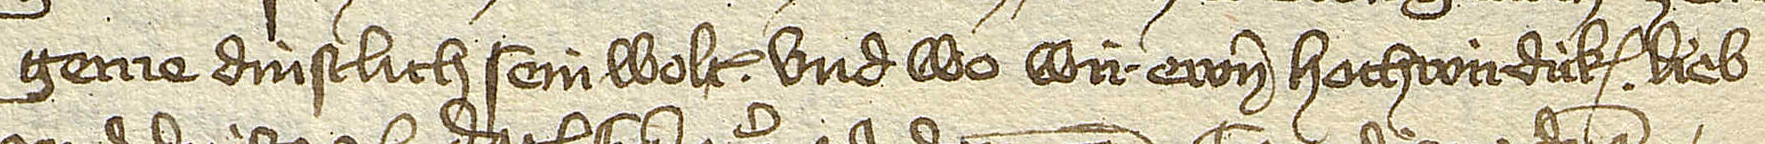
gerne dinſtlich ſein wolt*. vnd wo wir ewn* hochwirdick*. lieb
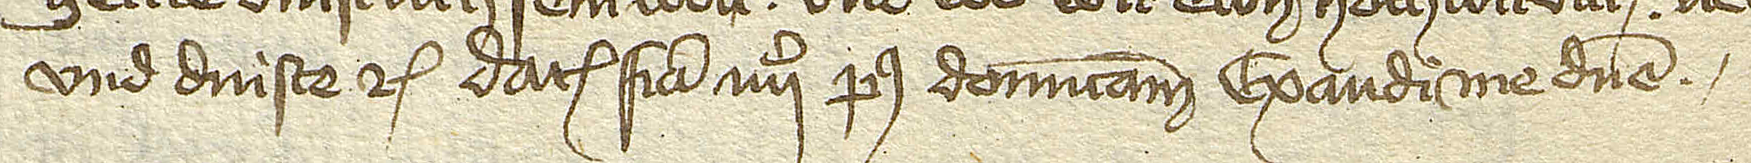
vnd dinſte ec* dat* fia* iiii* p* domicam* Exaudi me dne* . /
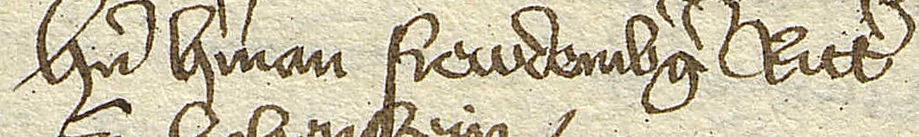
hn* h*man frewdemb*g* Ritt*
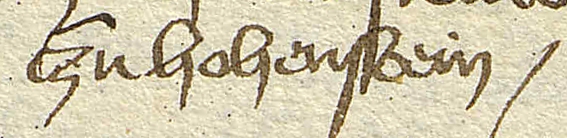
cʒu* hohenſtein /
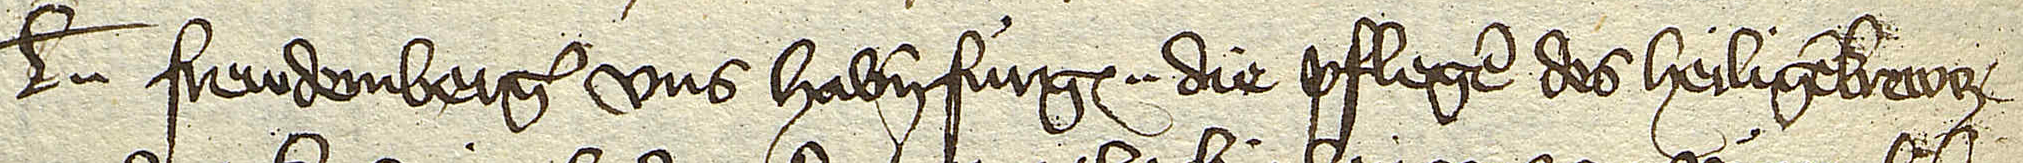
L* ~ frewdemberg* vns habn* fürg* ~ die pflege* des heilige* krewcʒ
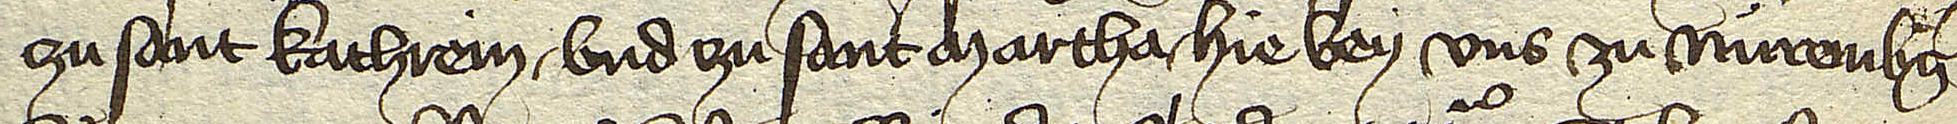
cʒu ſant kathrein / vnd cʒu ſant Martha / hie bey vns cʒu Nüremb*g
